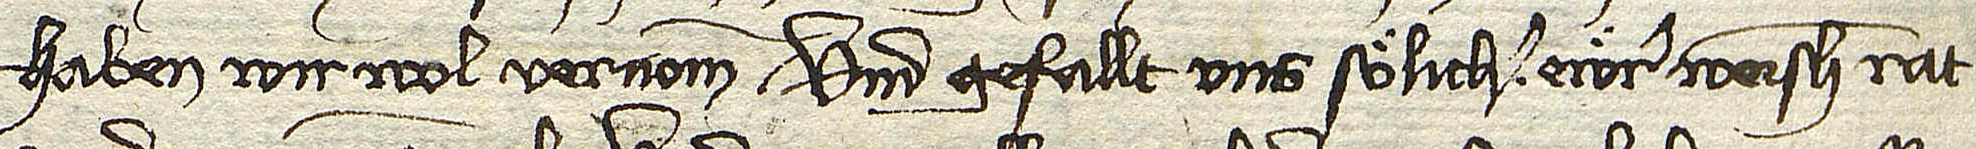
haben wir wol vernom* / Vnd gefallt vns ſölich* . ewr* weiſh* rat
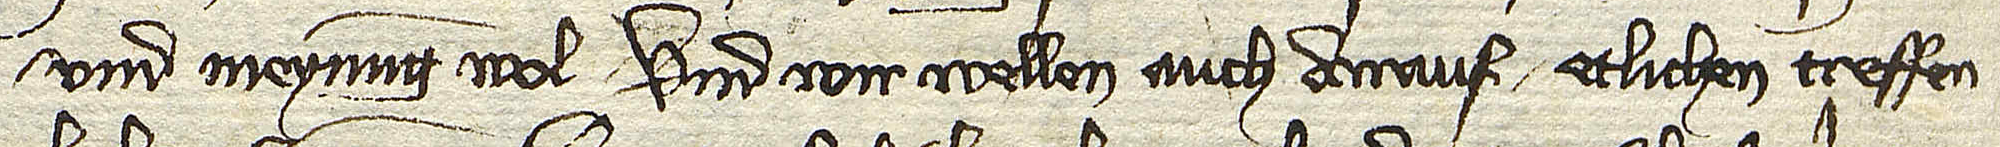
vnd meynug* wol / Vnd wir wellen auch darauf / etlichen treffen =
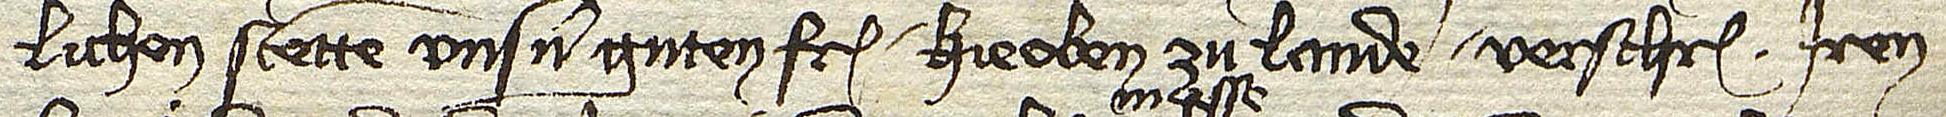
lichen ſtette* vnſ n* guten fr* / hieoben ʒu lande / verſchr* . Iren
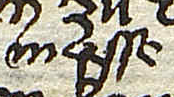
maſſe
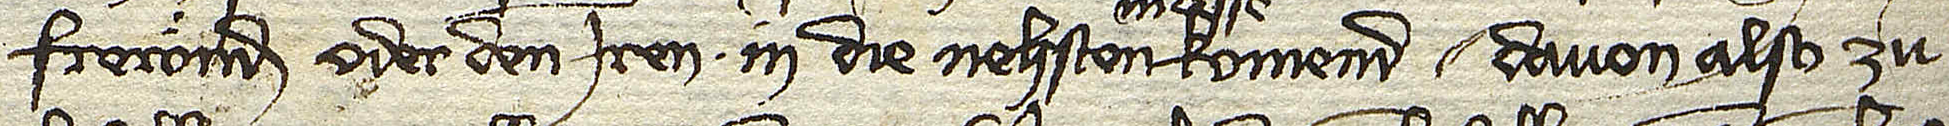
frewnd* oder den Iren . in die nehſten komend / dauon alſo ʒu
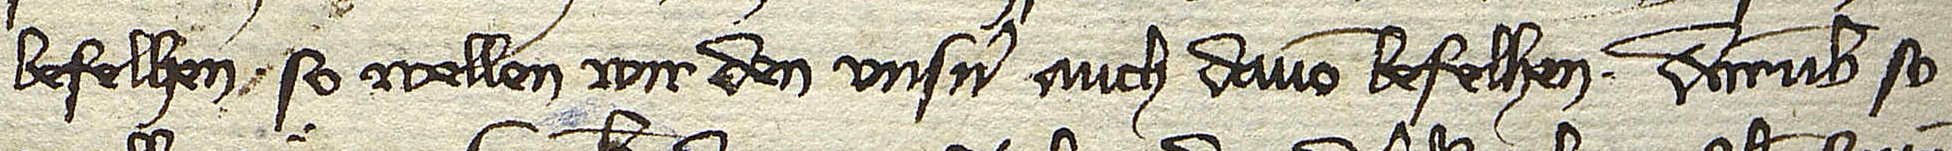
befelhen . ſo wellen wir den vnſn* auch dauo* befelhen . Darub* ſo
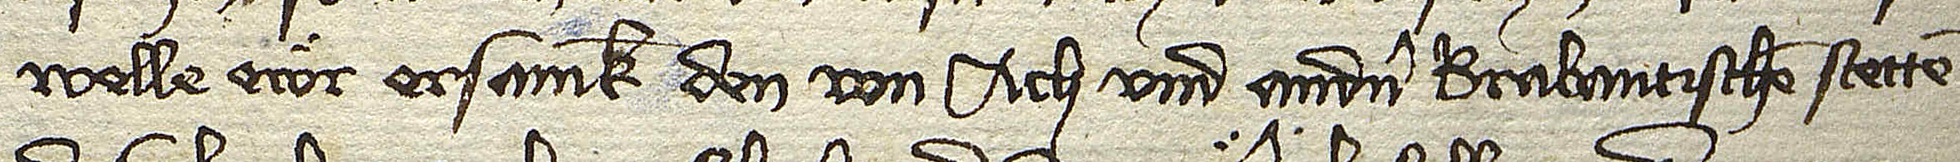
welle ewr erſamk* den von Ach vnd andn* Brabantiſche* ſtette*
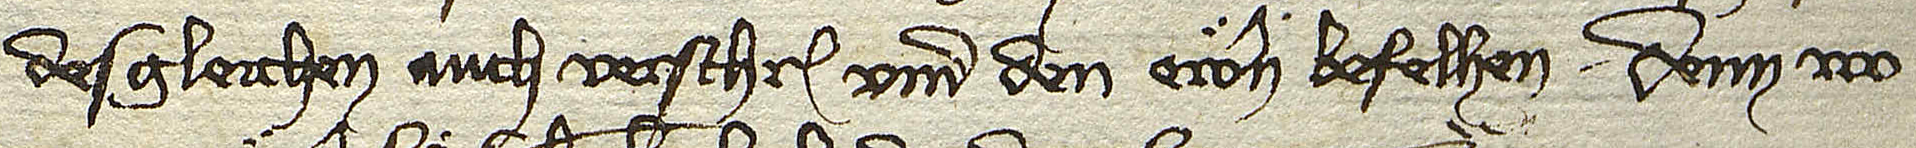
deſgleichen auch verſchr* vnd den ew*n befelhen / Denn wo
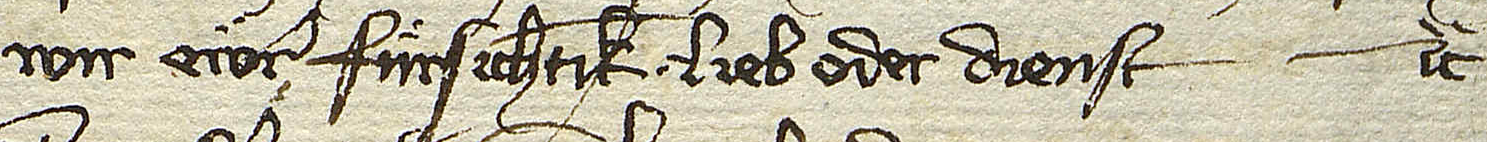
wir ewr* fürſichtik* . Lieb oder dienſt ec*
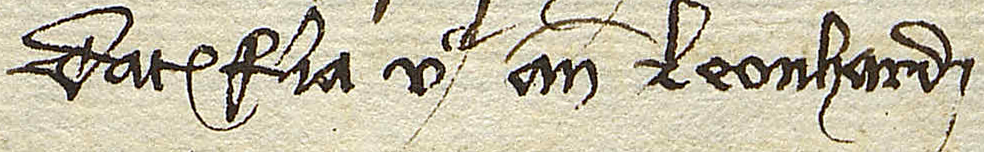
Dat* fi*a v* an* Leonhardi
